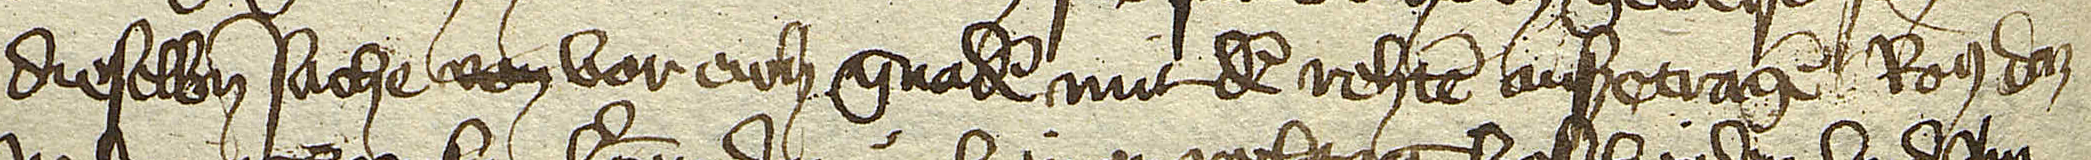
dieſelbn* ſache von vor ewn* gnade* mit d* rehte* auſʒetrage* Ro* daʒ
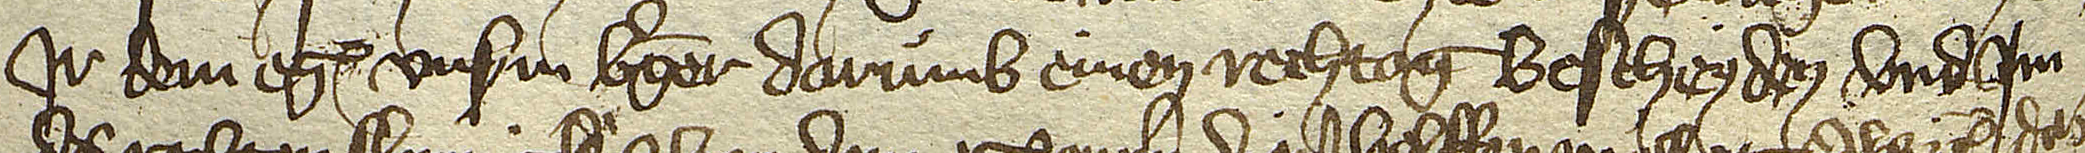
Ir dem eg* vnſ*m b*ger darümb einen rechtag Beſcheyden / vnd Im
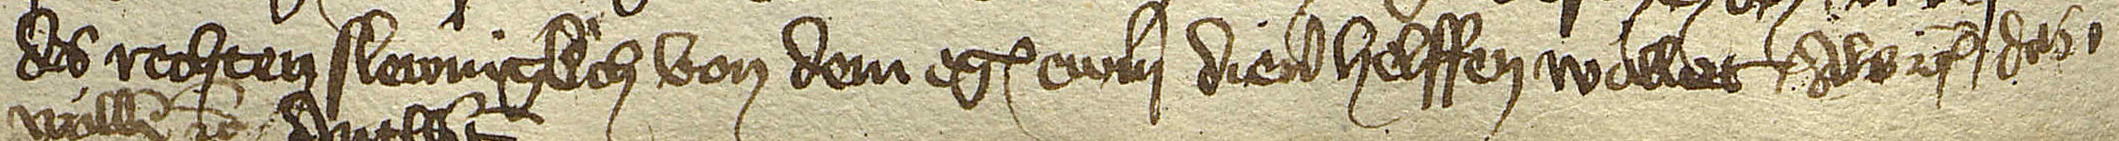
des rechten ſlewniglich von dem eg* ewm* dien* helffen wöllet / Als ec* das
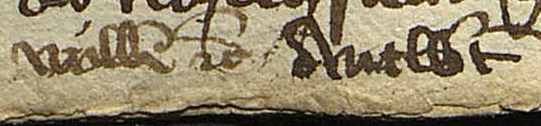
wölle* ec* Antwt*
